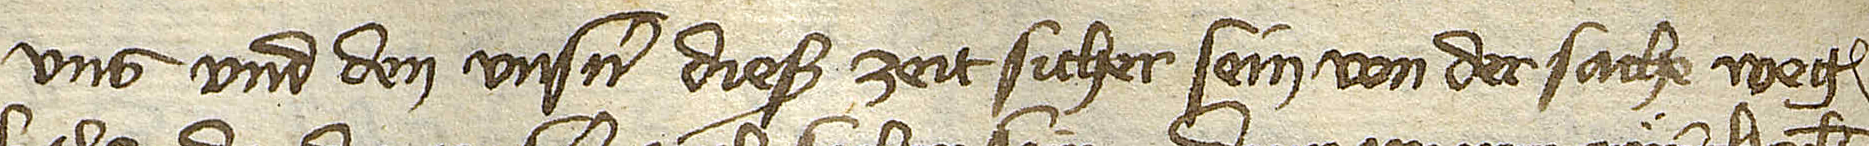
vns vnd den vnſn* dieſ* ʒeit ſicher ſein von der ſache weg*
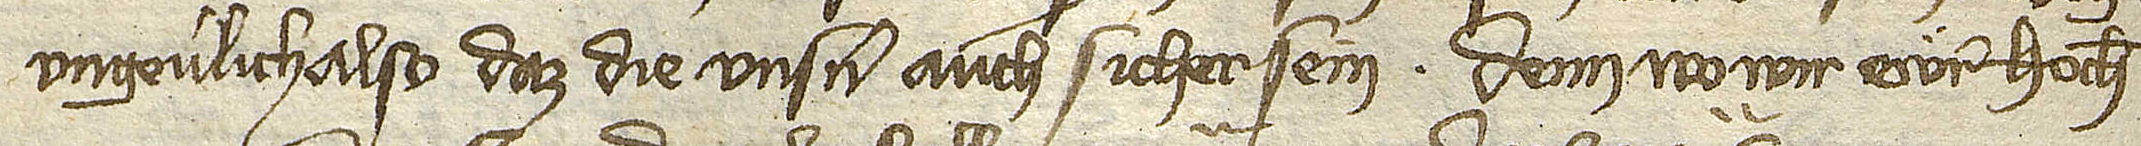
vngeu*lich alſo daʒ die vnſn* auch ſicher ſein . Denn wo wir eẅr* hoch*
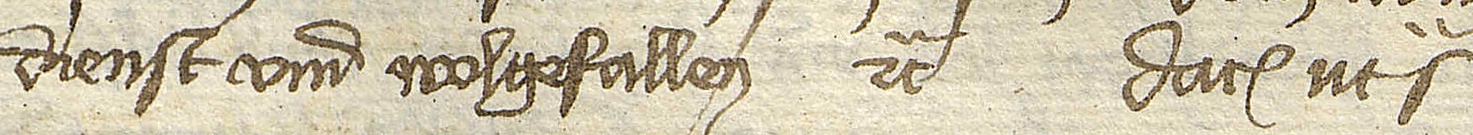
dienſt vnd wolgefallen ec* Dat* ut ſ*
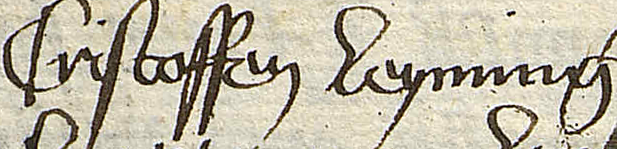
Criſtoffen Leyning*
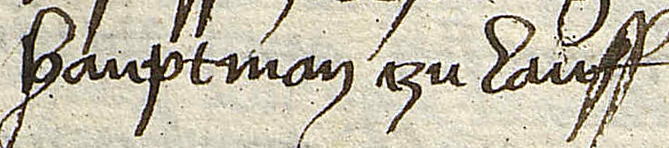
hauptman cʒu Lauff
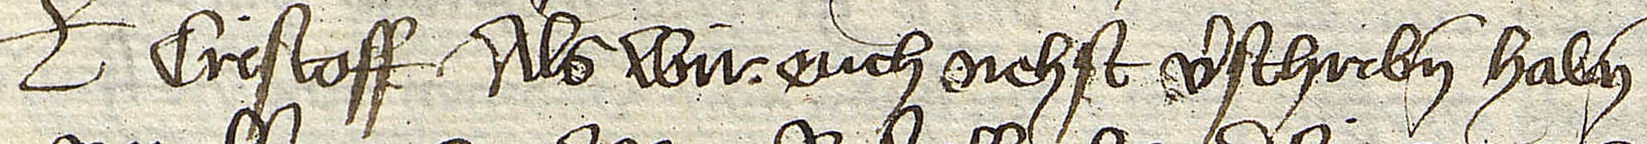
L* Criſtoff / Als wir euch nehſt v*ſchribn* habn*
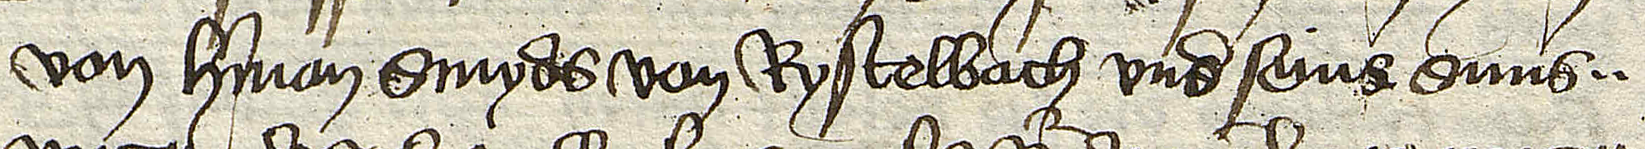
von h*man Smyds von Ryſtelbach vnd ſeins Suns ~
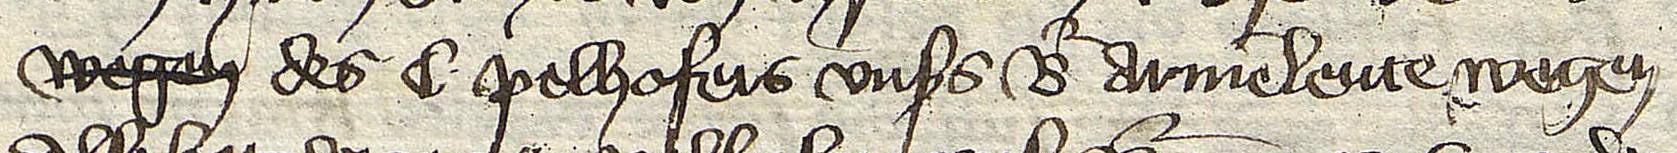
wegen des C . pelhofers vnſ*s B* Arme*leute wegen
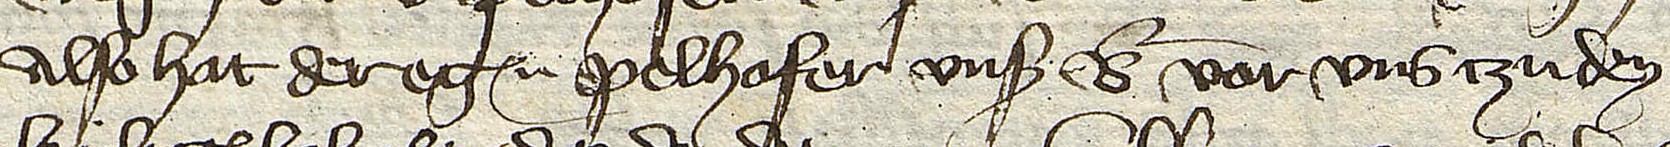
Alſo hat der eg* ~ pelhofer vnſ* B* vor vns cʒu den
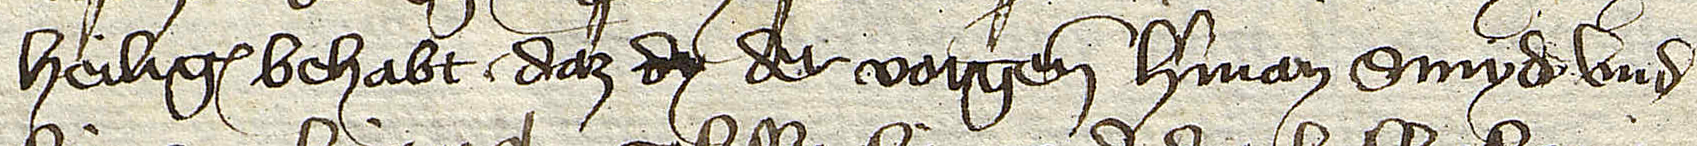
heilig* behabt / daʒ dy der vorgen* h*man Smyd vnd
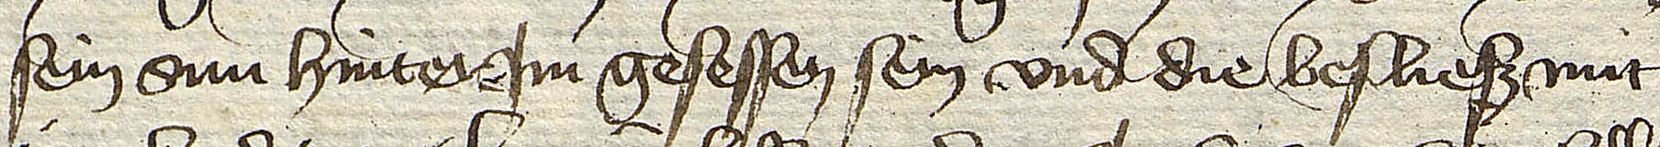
ſein Sun hinter Im geſeſſen ſein vnd die beſlieſʒ mit
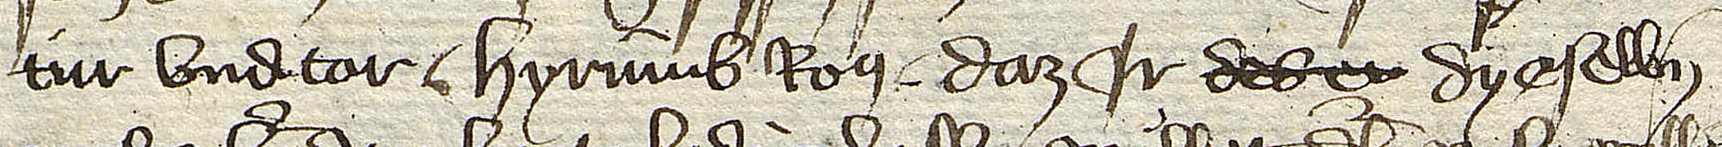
tür vnd tor / Hyrümb Ro* / daʒ Ir des er dyeſelbn*
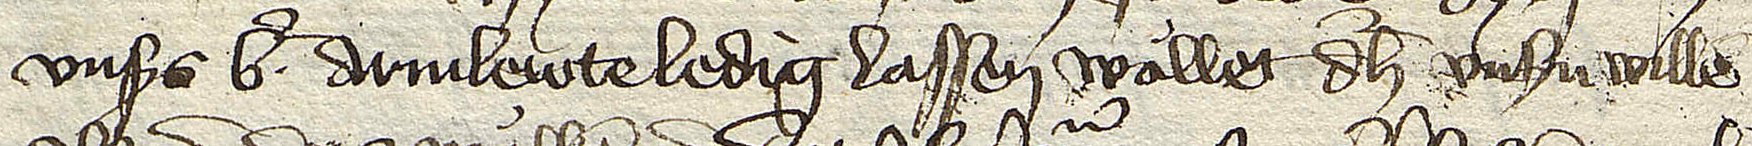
vnſ*s b* Armlewte ledig laſſen wöllet d*h vnſ*n wille*
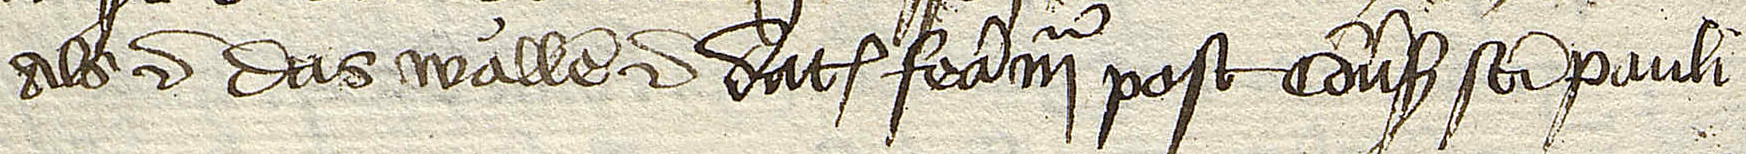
Als ec* Das wölle* ec* Dat* fea* iii* poſt Cou*ſ* ſci* Pauli
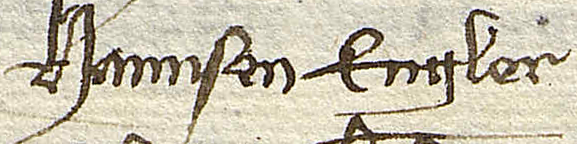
Hannſen Engler
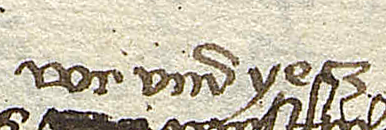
vor vnd yecʒ
